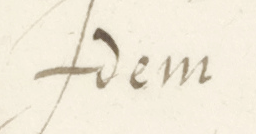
Idem
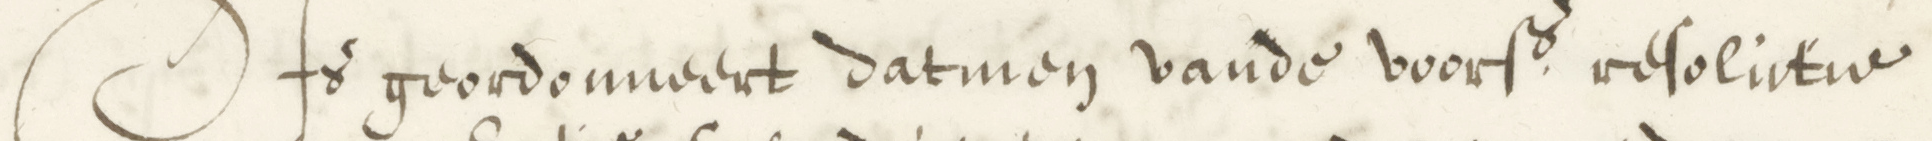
Is geordonneert datmen vande voors. resolutie
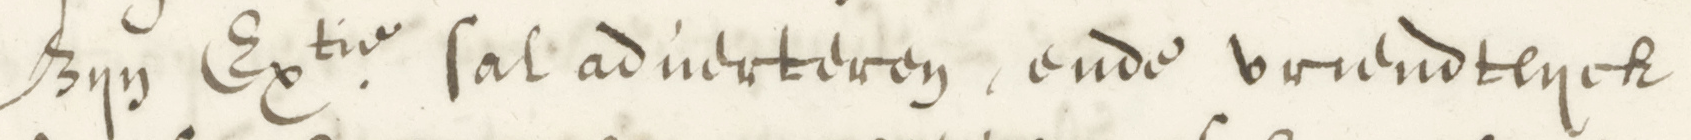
zijn Extie. sal aduerteren, ende vriendtlyck
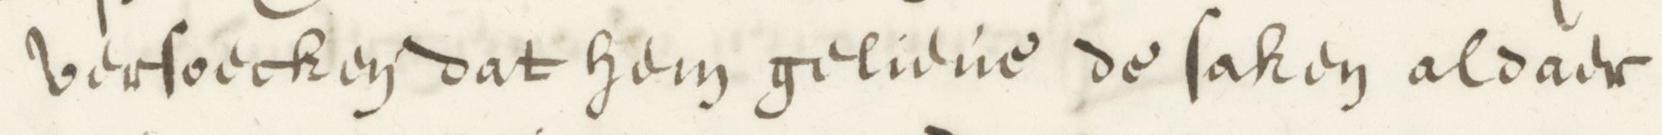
versoecken dat hem gelieue de saken aldaer
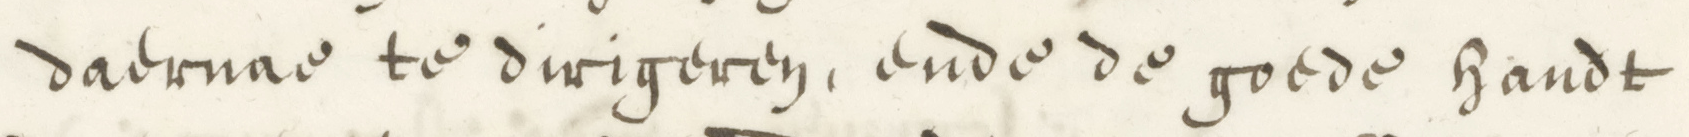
daernae te dirigeren, ende de goede handt
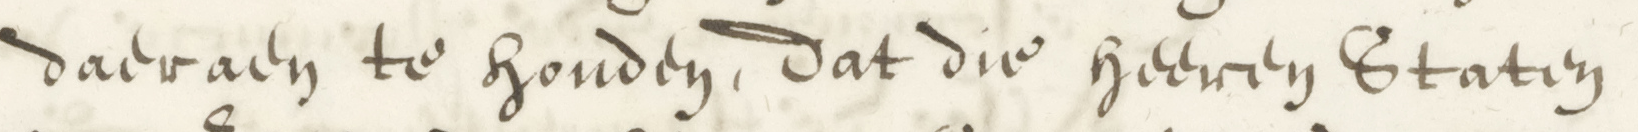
daeraen te houden, dat die heeren Staten
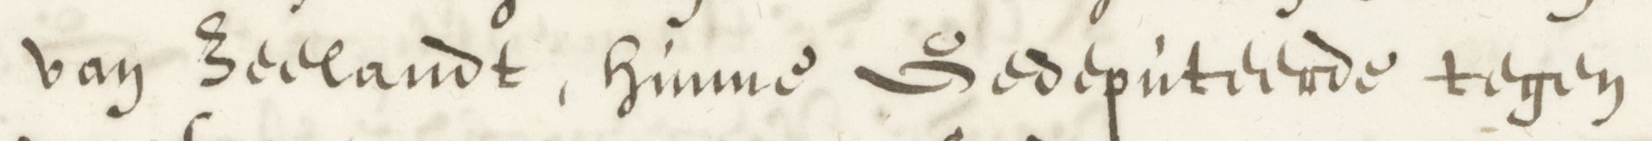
van Zeelandt, hunne Gedeputeerde tegen
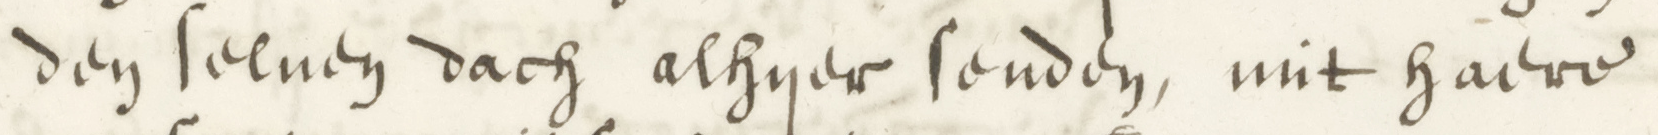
den seluen dach alhyer senden, mit haere
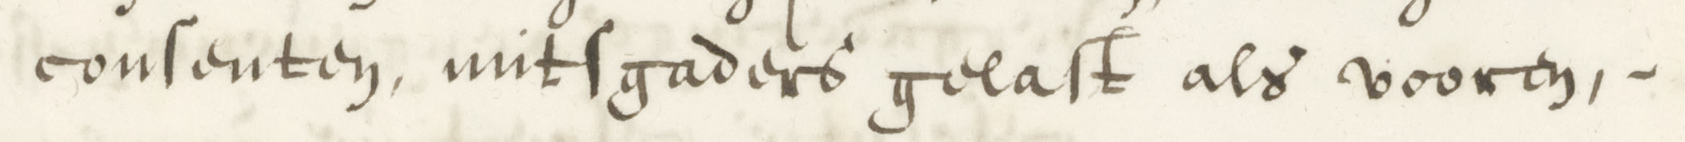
consenten, mitsgaders gelast als vooren. -
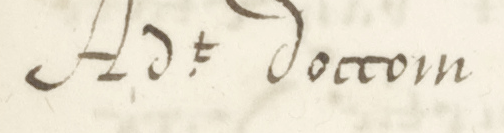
Adt. Doccom
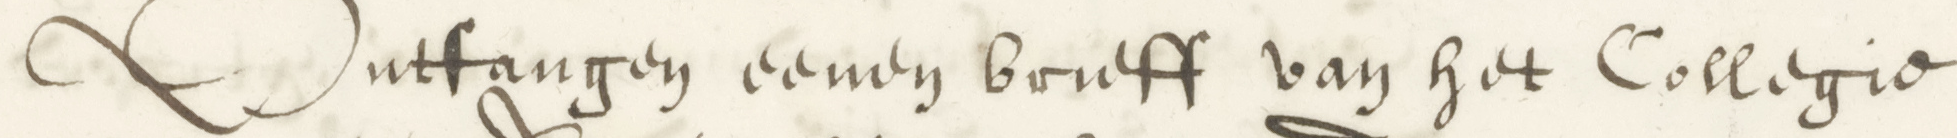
Ontfangen eenen brieff van het Collegie
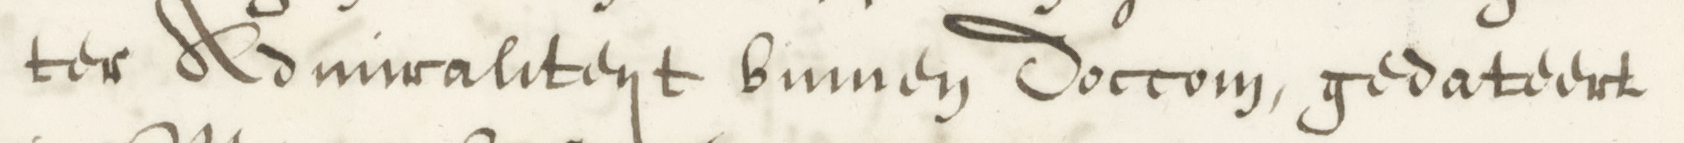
ter Admiraliteyt binnen Doccom, gedateert
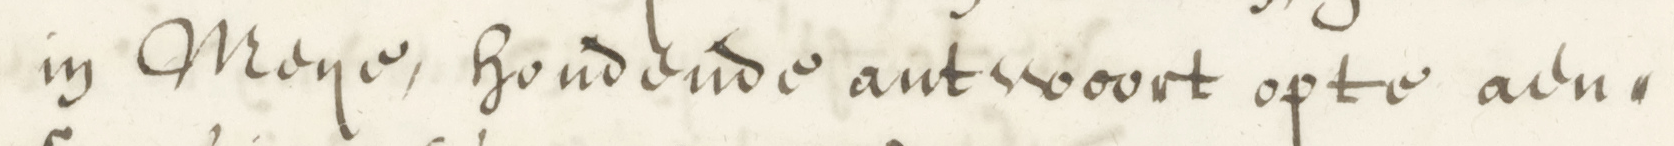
in Meye, houdende antwoort opte aen„
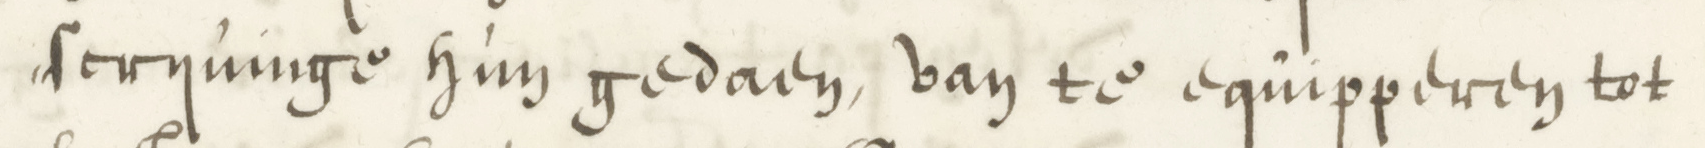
„scryuinge hun gedaen, van te equipperen tot
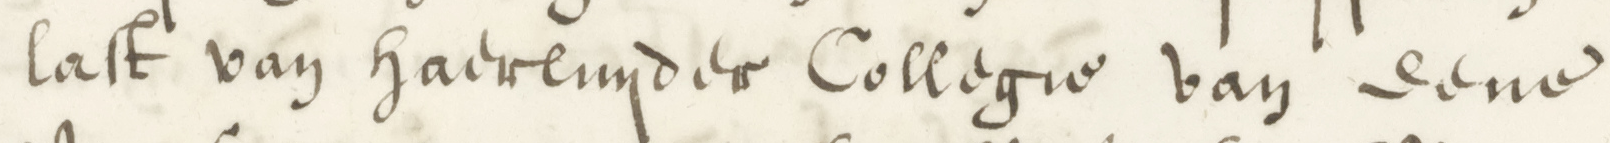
last van haerluyder Collegie van Eene
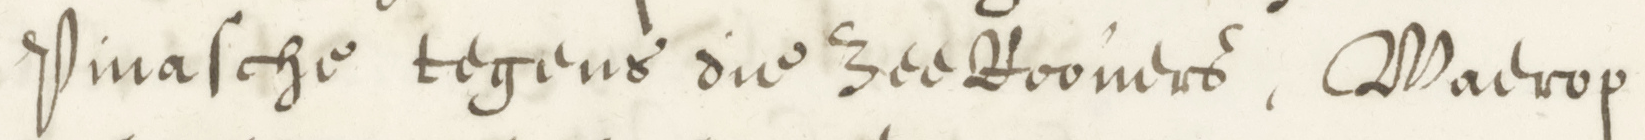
Pinasche tegens die zeeRoouers, Waerop
